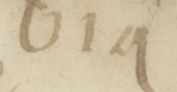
614
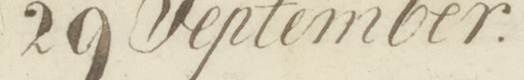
29 September.
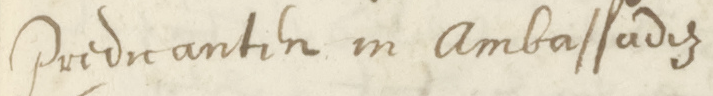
Predicanten in Ambassaden
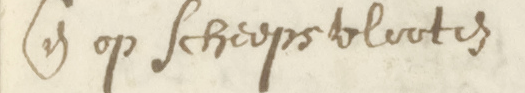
& op scheepsvlooten
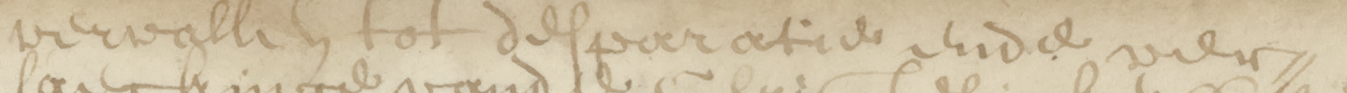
vervallen tot desparatie ende ver„
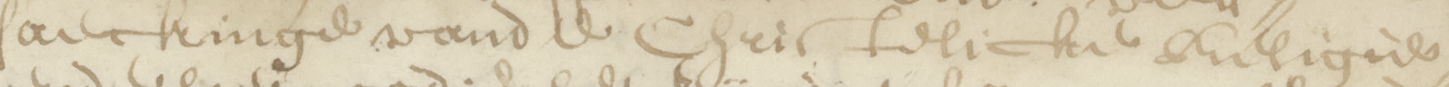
saeckinge vande Christelicke Religie
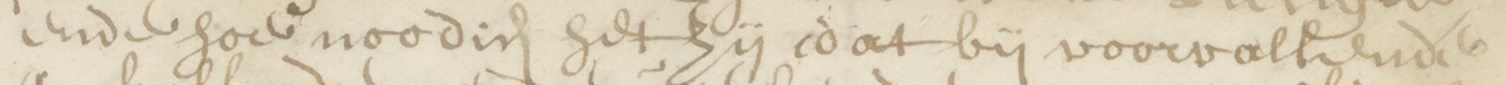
ende hoe noodich het zij dat bij voorvallende
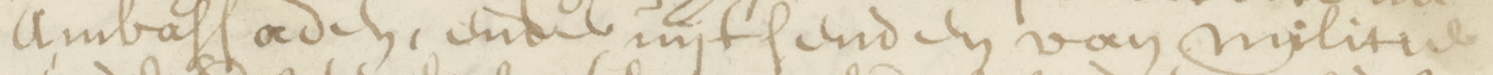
Ambassaden, ende uijtsenden van militie
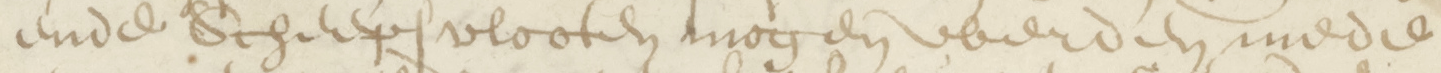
ende Scheepsvlooten mogen werden mede
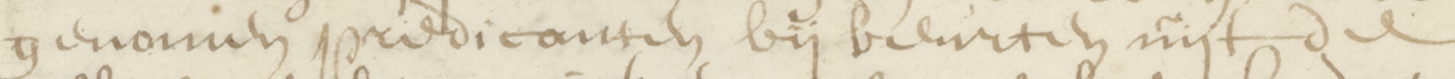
genomen predicanten bij beurten uijt de
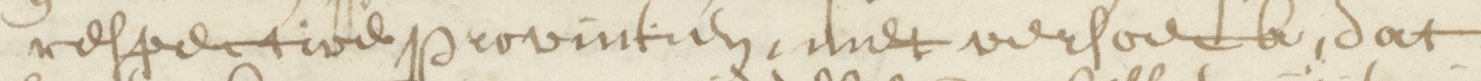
respective provintien, met versoeck, dat
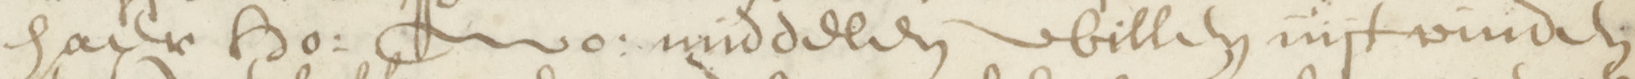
haer Ho:Mo: middelen willen uijtvinden
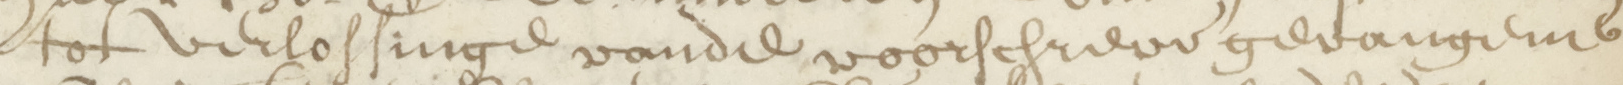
tot verlossinge vande voorschreve gevangene
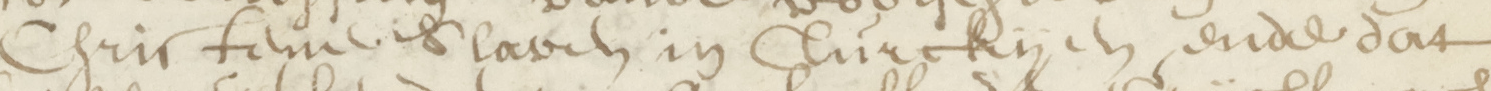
Christene Slaven in Turckijen ende dat
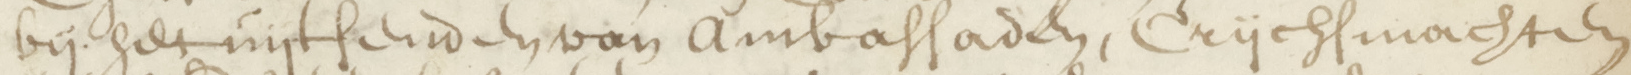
bij het uijtsenden van Ambassaden, Crijchsmachten
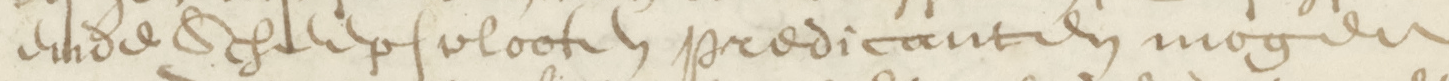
ende Scheepsvlooten predicanten mogen
